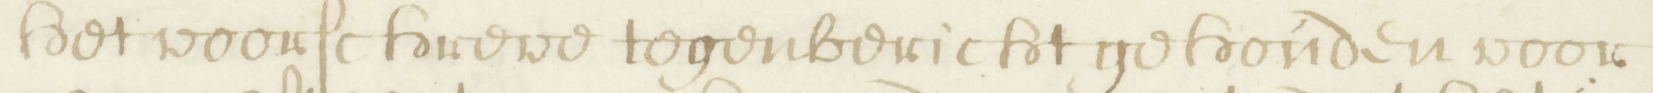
het voorschreve tegenbericht gehouden voor
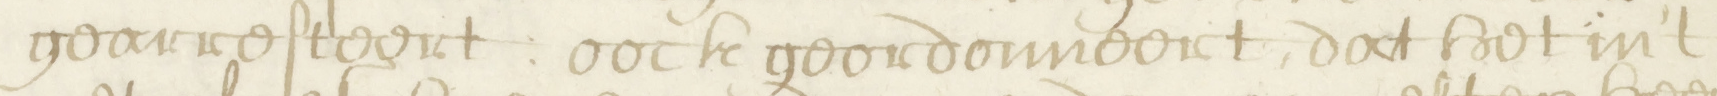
gearresteert: oock geordonneert, dat het in't
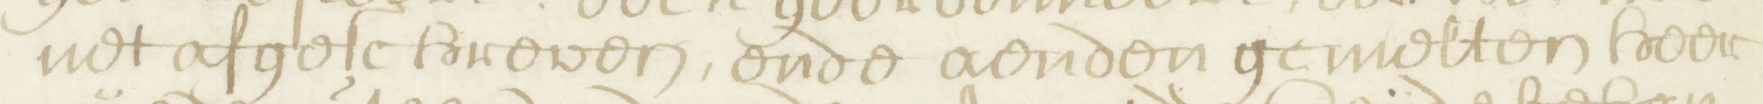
net afgeschreven, ende aenden gemelten heer
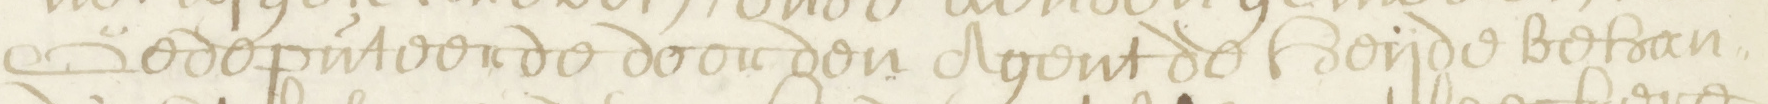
Gedeputeerde door den Agent de Heijde behan,,
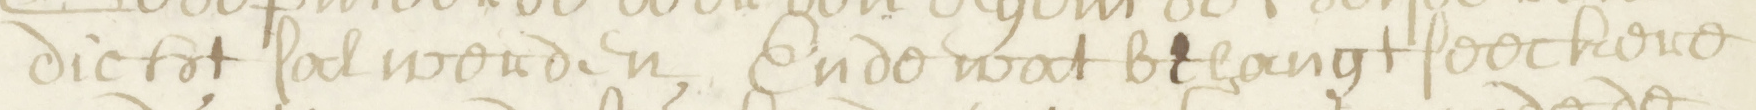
dicht sal werden. Ende wat belangt seeckere
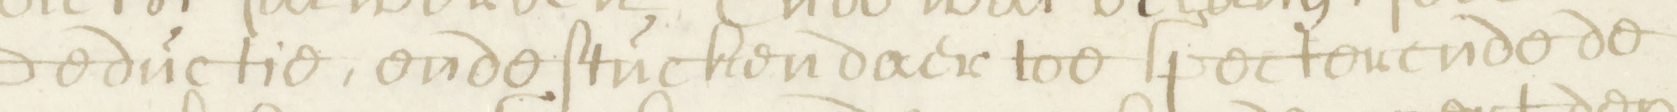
deductie, ende stucken daer toe specterende de
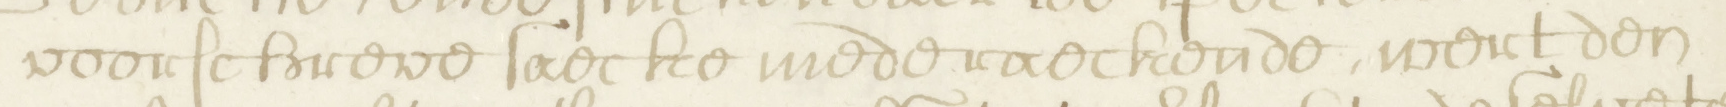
voorschreve saecke mede raeckende, wert den
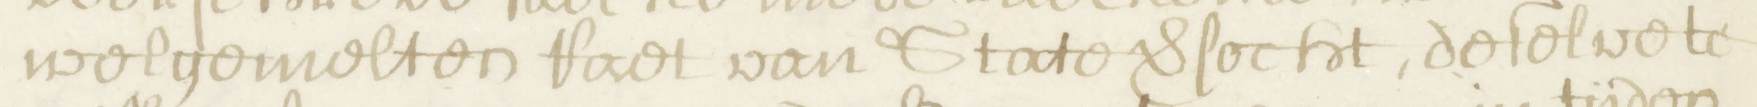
welgemelten Raet van State vsocht, deselve te
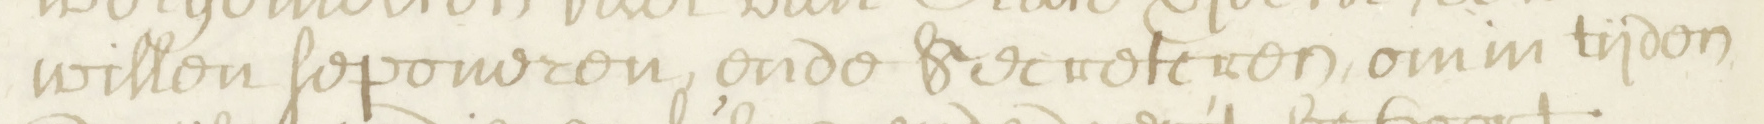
willen seponeren ende secreteren, om in tijden
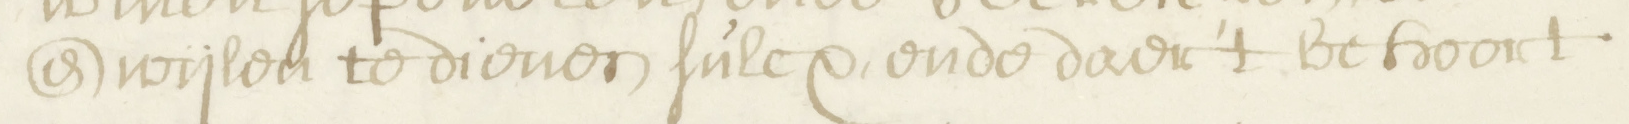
& wijlen te dienen sulcx, ende daer't behoort.
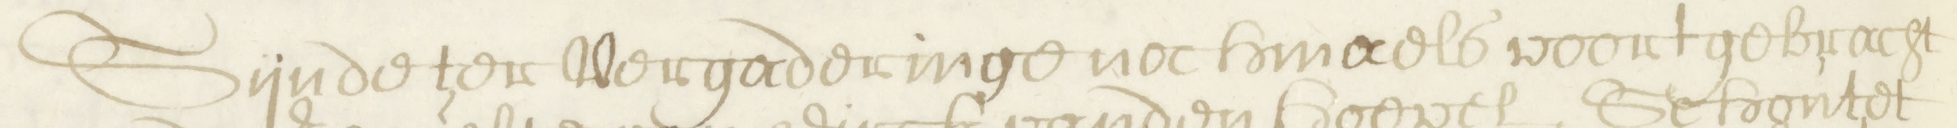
Sijnde ter Vergaderinge nochmaels voortgebracht
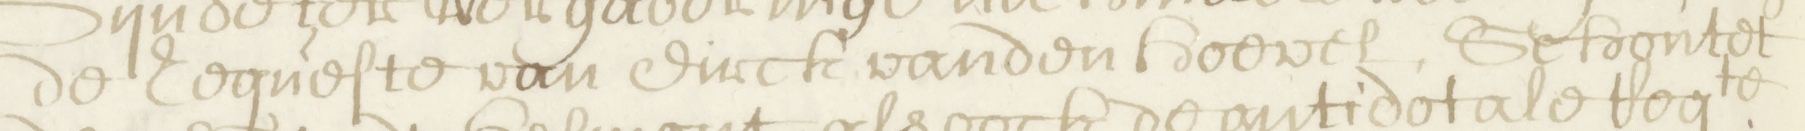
de requeste van dirck vanden hoevel, Schoutet
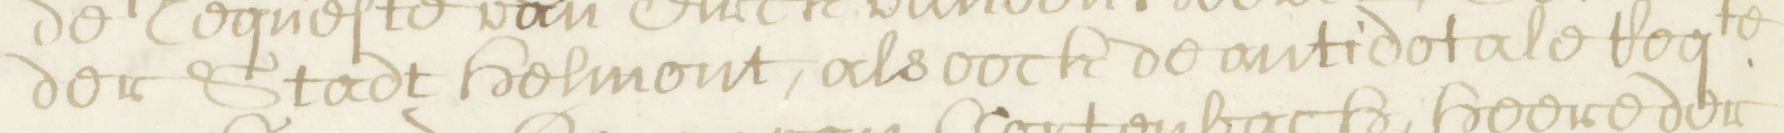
der Stadt helmont, als oock de antidotale Reqte
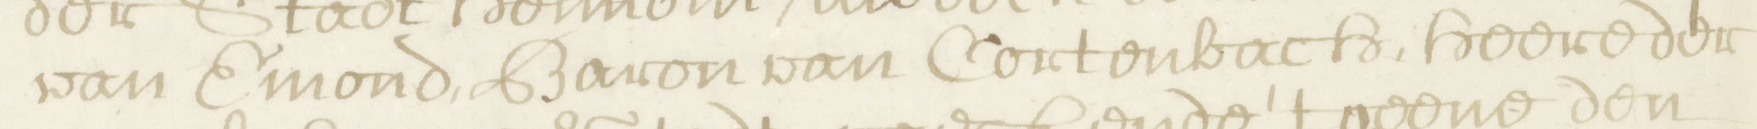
van Emond, Baron van Cortenbach, heere der
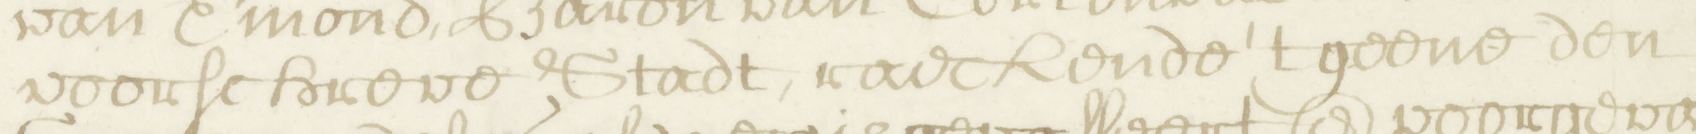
voorschreve Stadt, raeckende 't geene den
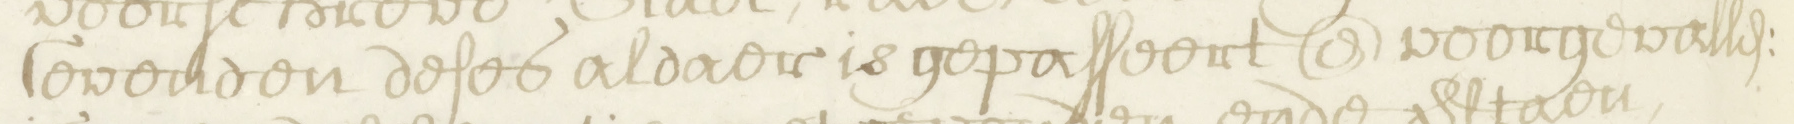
sevenden deses aldaer is gepasseert & voorgevallen:
